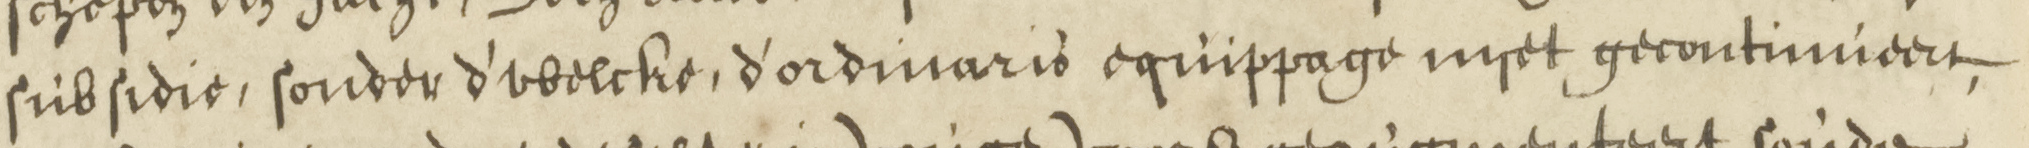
subsidie, sonder d'welcke, d'ordinaris equippage nyet gecontinueert,
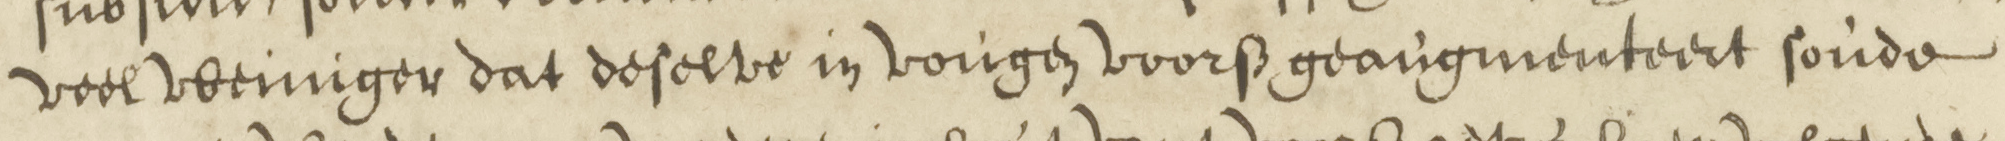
veel weiniger dat deselve in vougen voors geaugmenteert soude
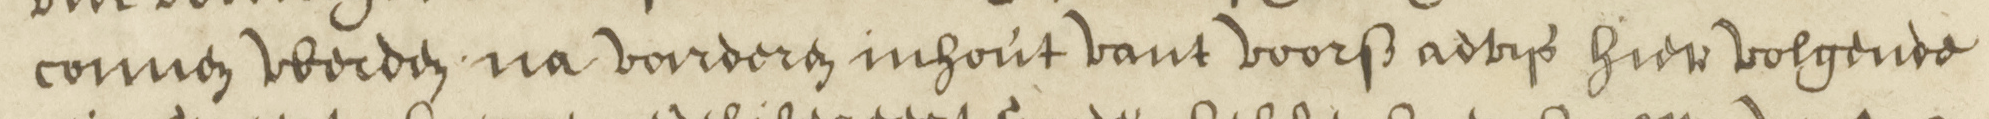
connen worden na vordere inhout vant voors advys hier volgende
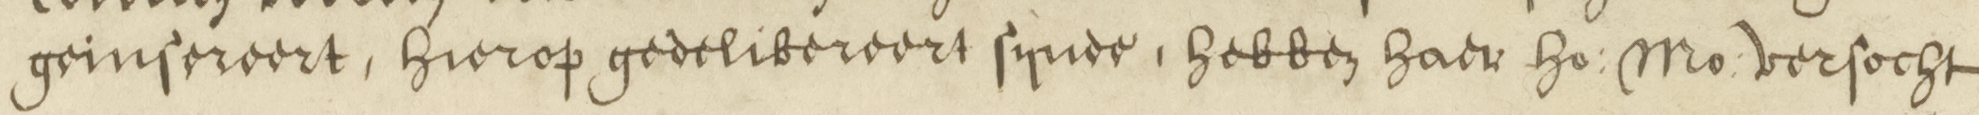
geinsereert, hierop gedelibereert synde, hebben haer Ho:Mo: versocht
